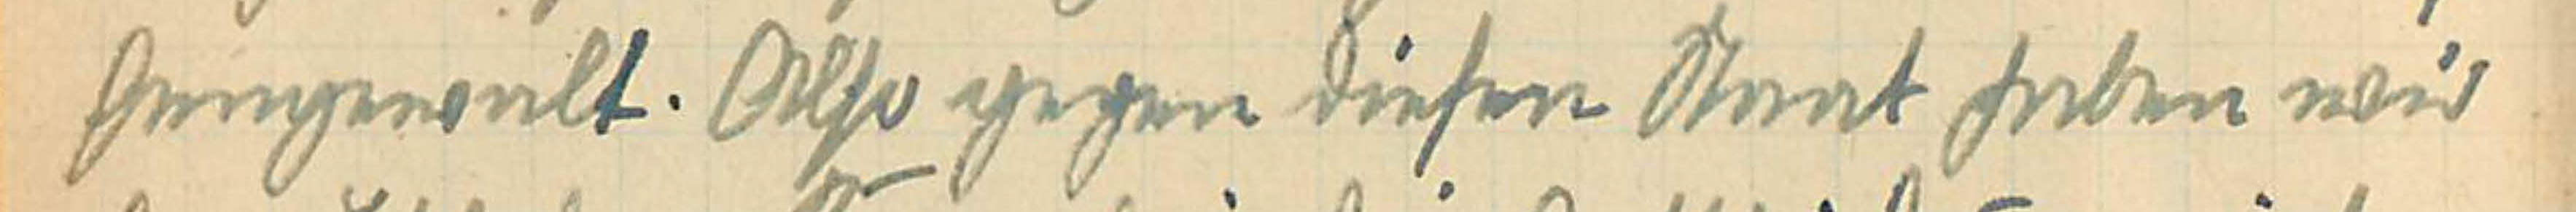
fengewalt. Also gegen diesen Staat haben wir
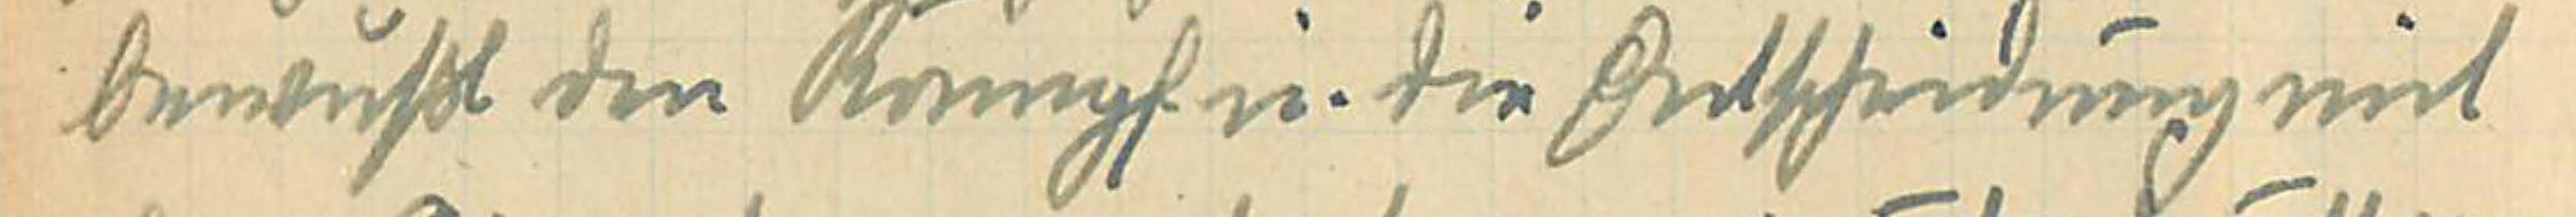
bewußt den Kampf u. die Entscheidung mit
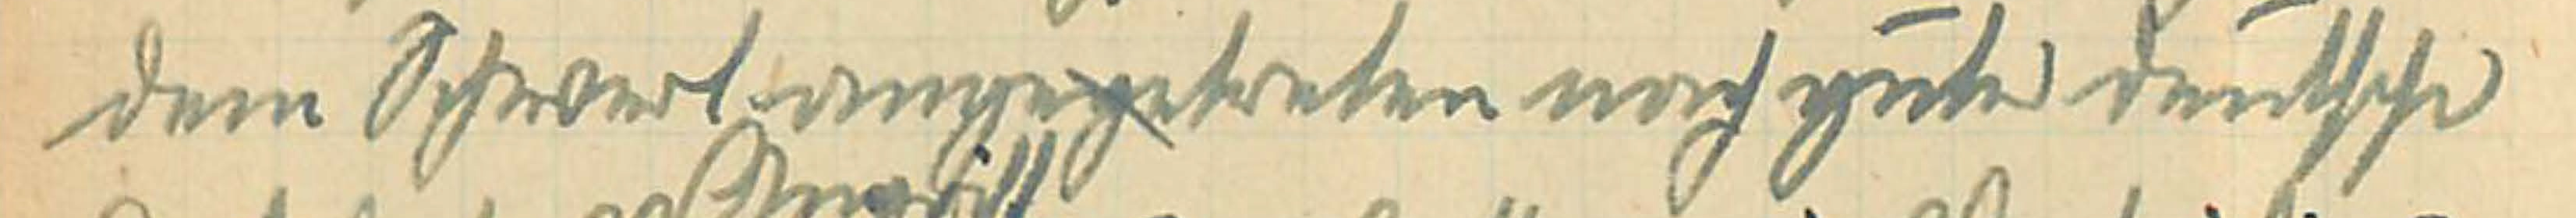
dem Schwert angegetreten nach guter deutscher
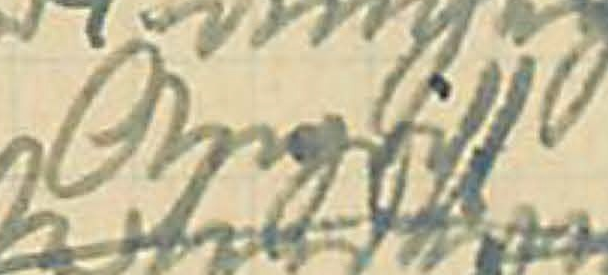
Angriff
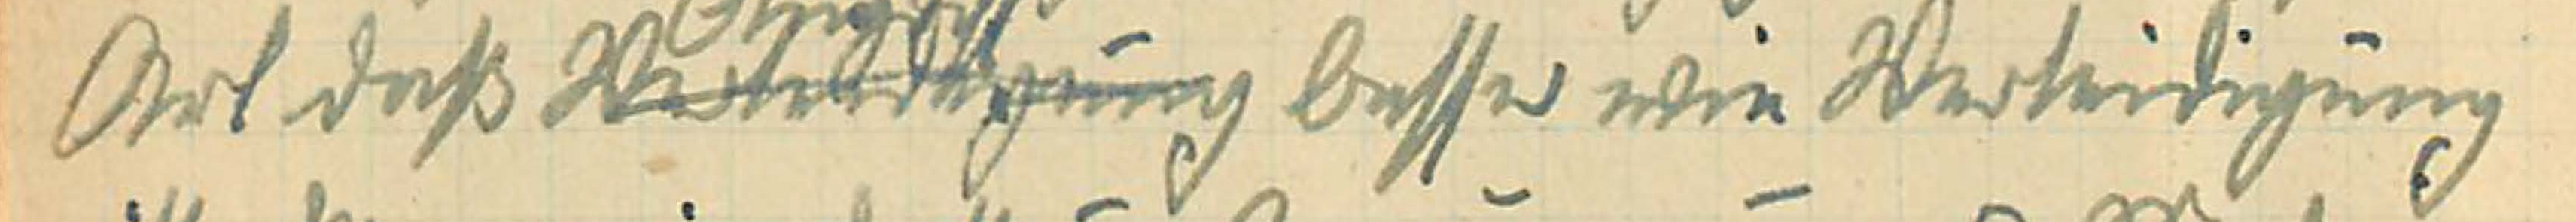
Art daß Verteidigung besser wie Verteidigung
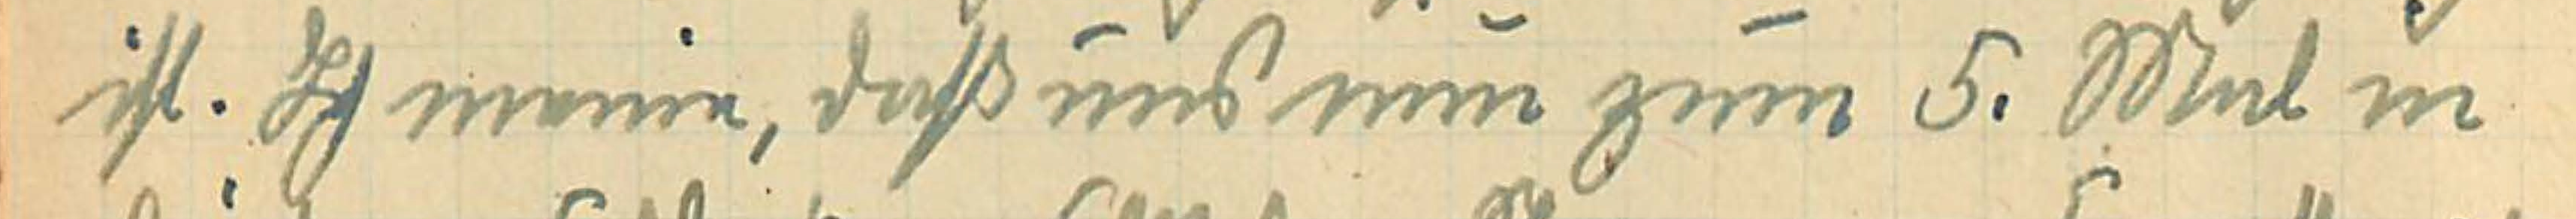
ist. Ich meine, daß uns nun zum 5. Mal in
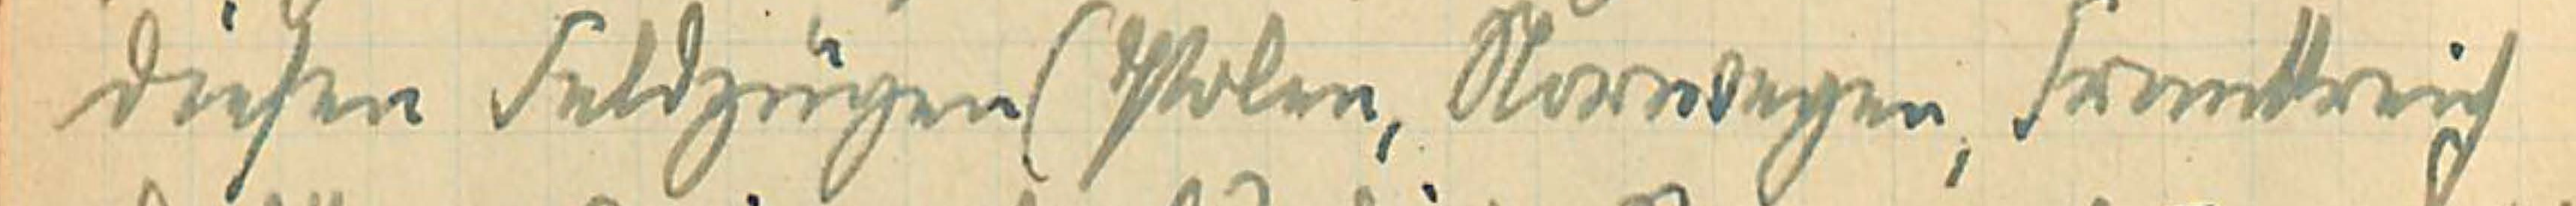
diesen Feldzügen (Polen, Norwegen, Frankreich
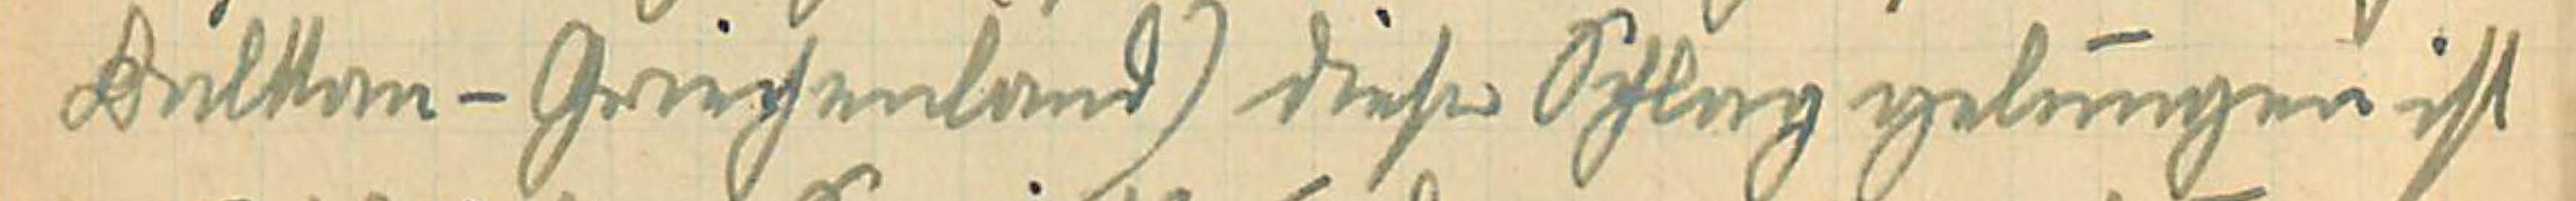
Balkan – Griechenland) dieser Schlag gelungen ist
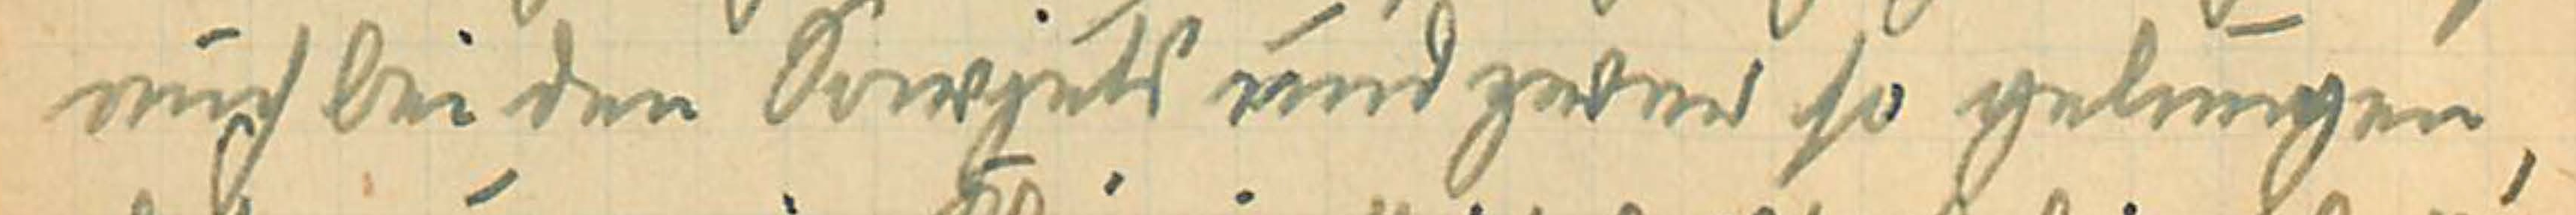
auch bei den Sowjets und zwar so gelungen,
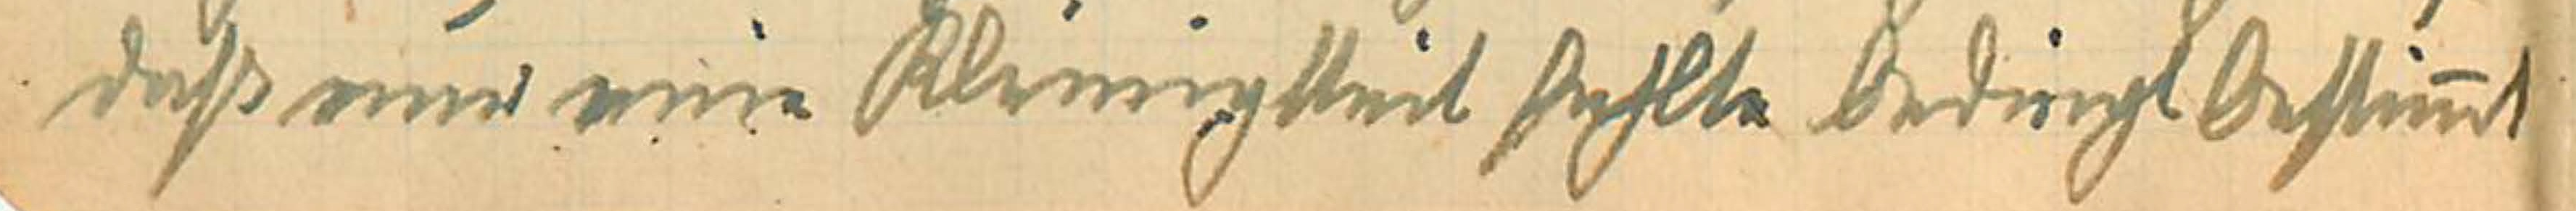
daß nur eine Kleinigkeit fehlte bedingt bestimmt
